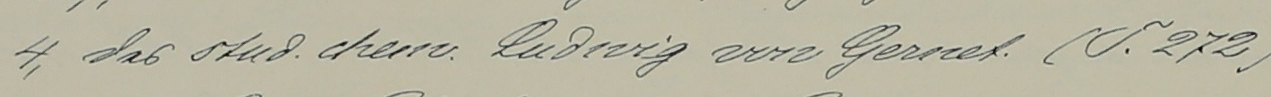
4. des stud. chem. Ludwig von Gernet. (T.272)
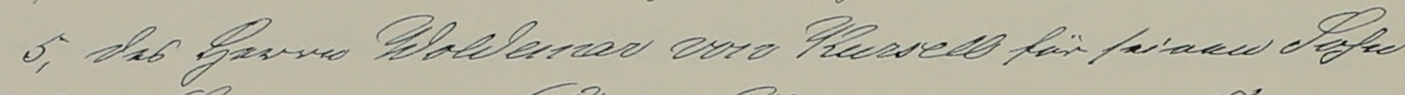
5. des Herrn Woldemar von Kursell für seinen Sohn
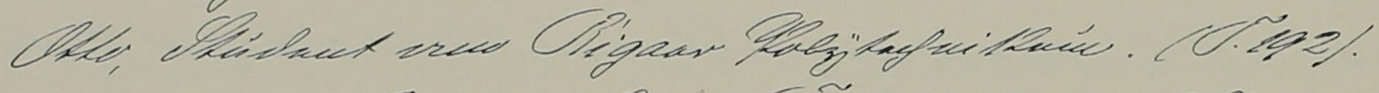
Otto, Student am Rigaer Polytechnikum. (T.192).
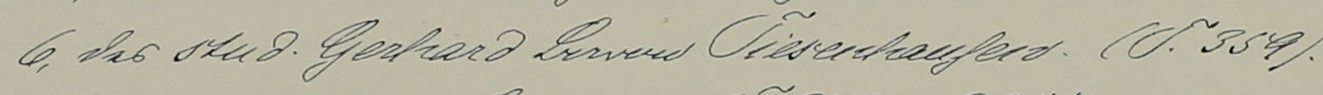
6. des stud. Gerhard Baron Tiesenhausen. (T.359).
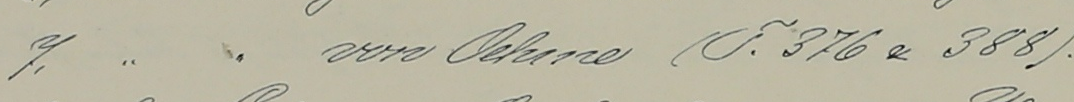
7. " " von Oehme (T.376 & 388).
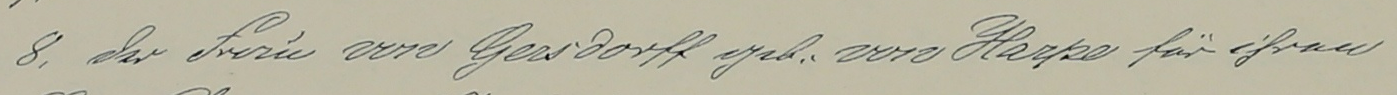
8. der Frau von Gersdorff geb. von Harpe für ihren
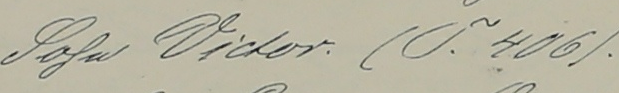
Sohn Victor. (T.406).
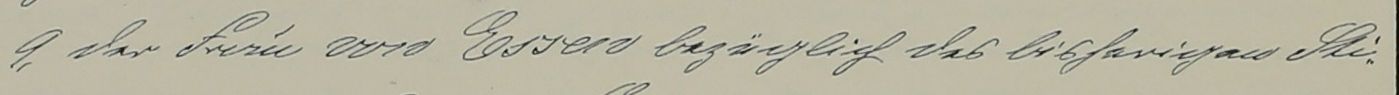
9. der Frau von Essen bezüglich des bisherigen Sti-
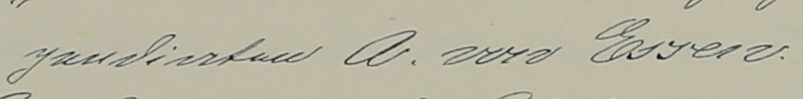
pendiaten A. von Essen.
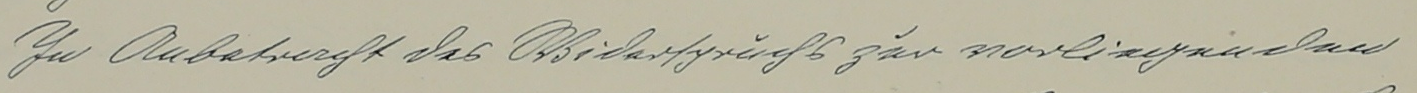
In Anbetracht des Widerspruchs zur vorliegenden
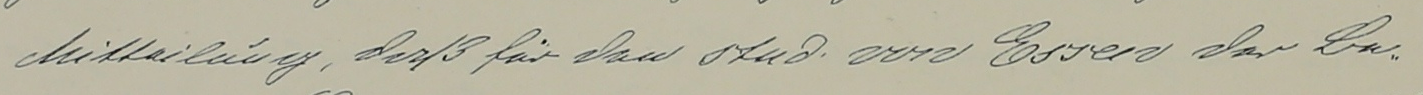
Mitteilung, daß für den stud. von Essen der Be-
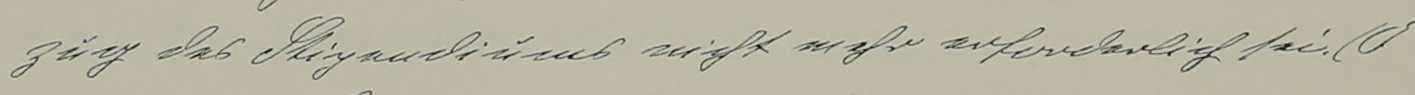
zug des Stipendiums nicht mehr erforderlich sei (T
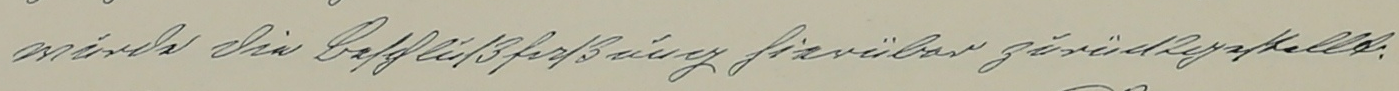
wurde die Beschlußfaßung hierüber zurückgestellt.
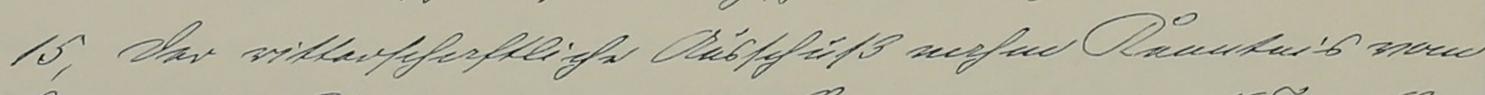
15. Der ritterschaftliche Ausschuß nahm Kenntnis vom
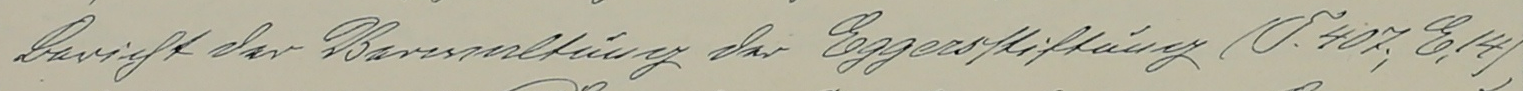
Bericht der Versammlung der Eggersstiftung (T.407; E.14)
